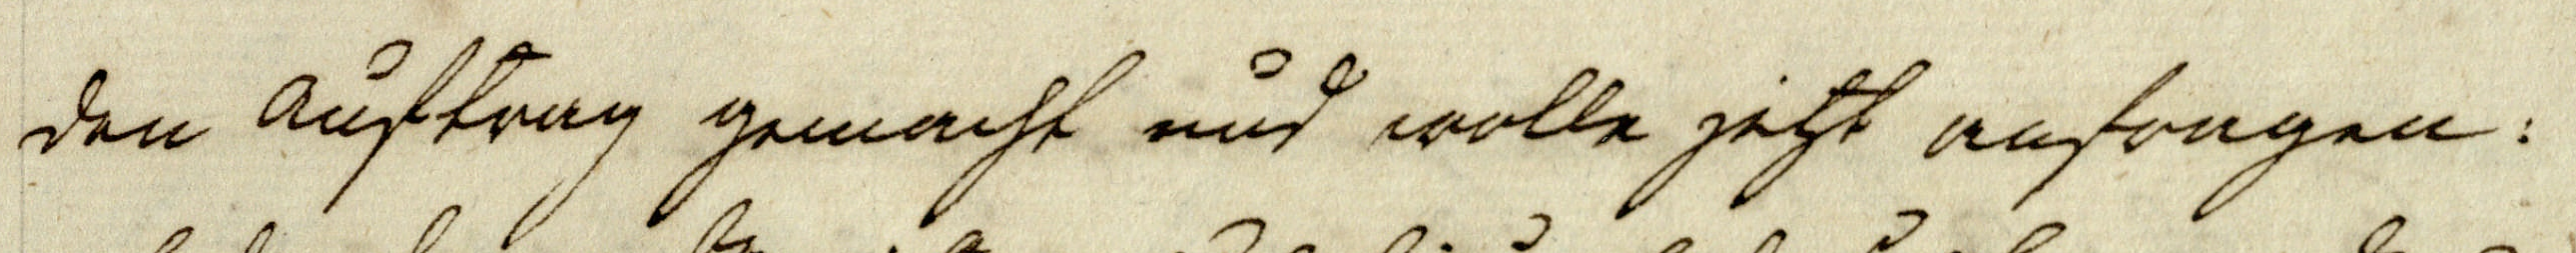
den Auftrag gemacht und wolle jetzt anfragen:
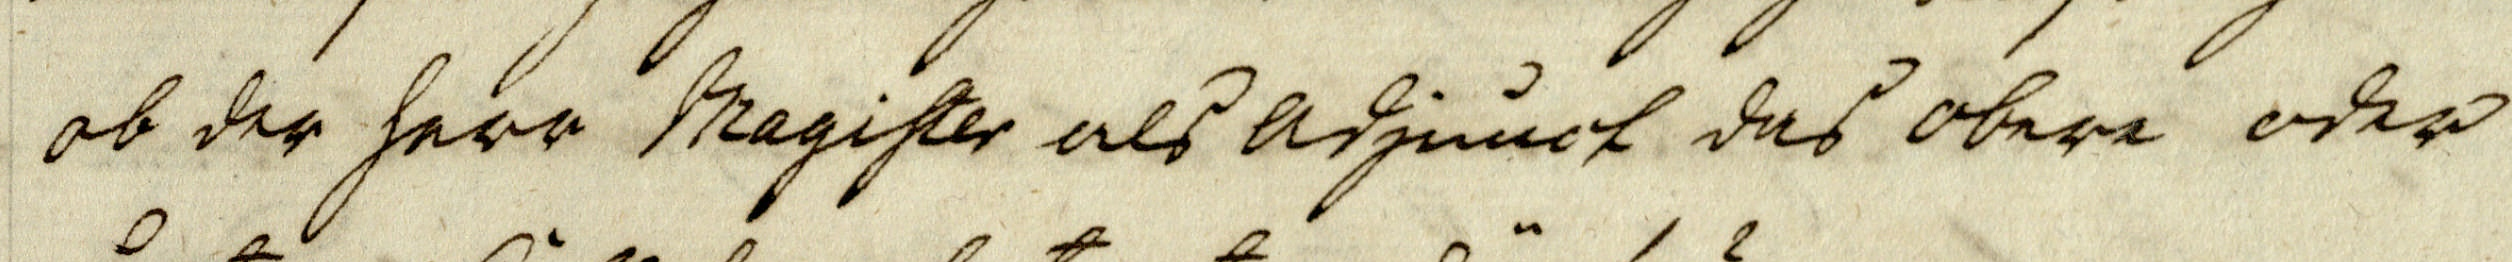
ob der Herr Magister als Adjunct das obere oder
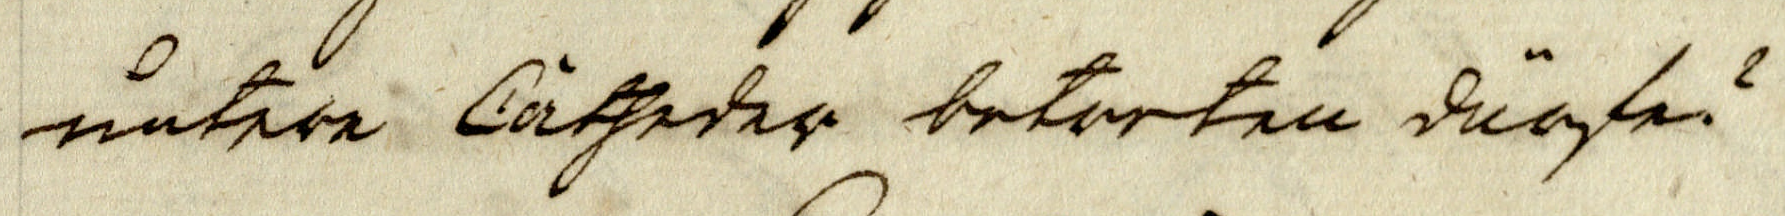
untere Catheder betreten dürfe?
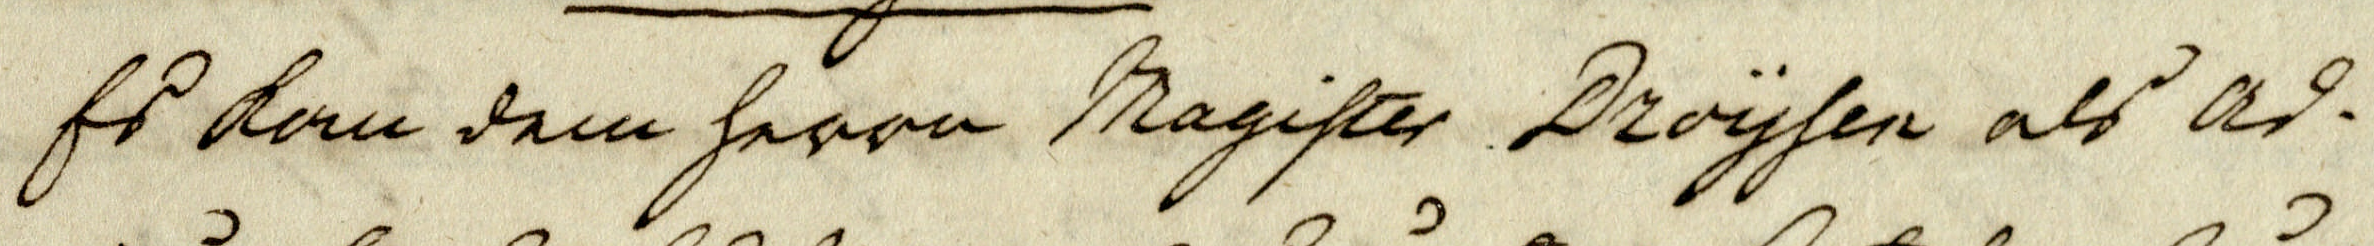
Es kan dem Herrn Magister Droÿsen als Ad¬
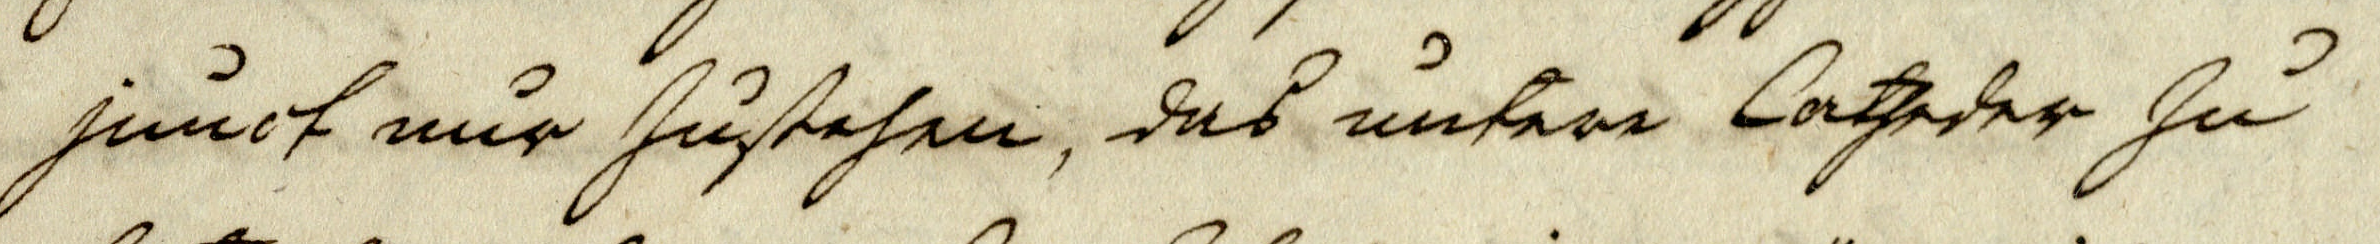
junct nur zustehen, das untere Catheder zu
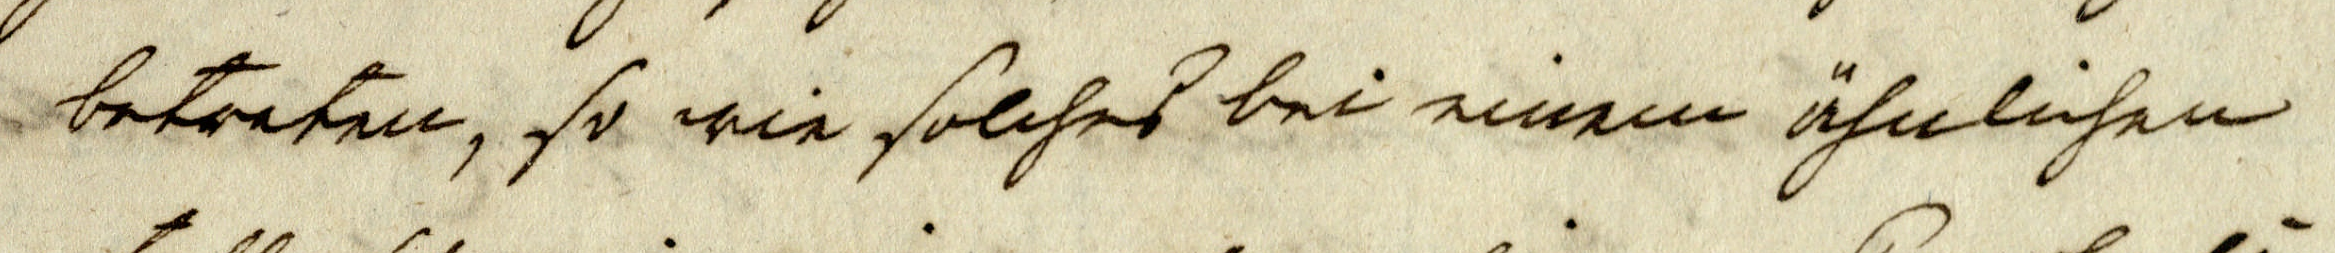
betreten, so wie solches bei einem ähnlichen
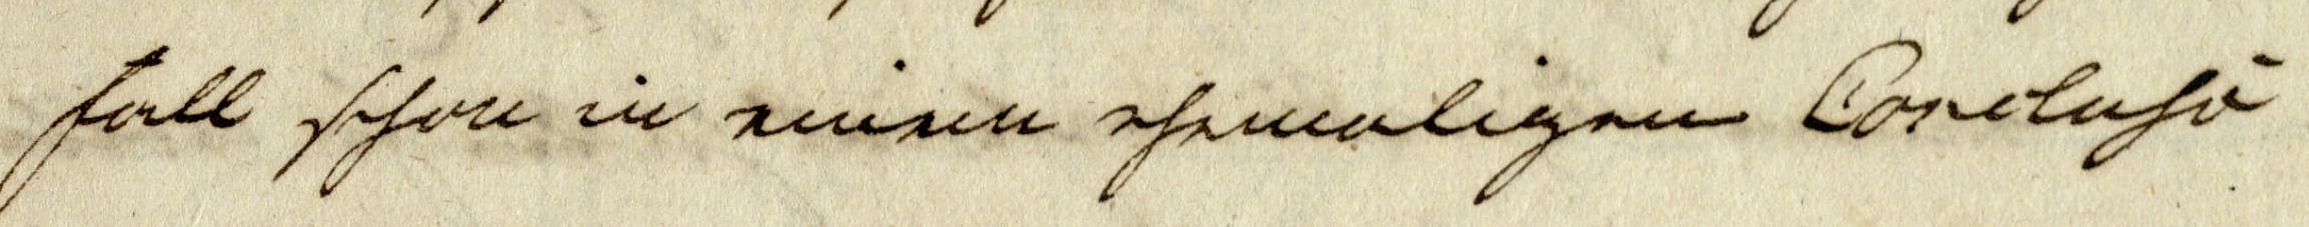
Fall schon in einem ehemaligen Concluso
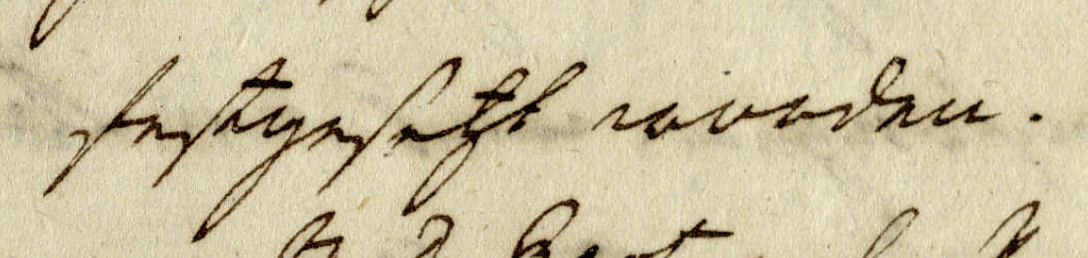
festgesetzt worden.
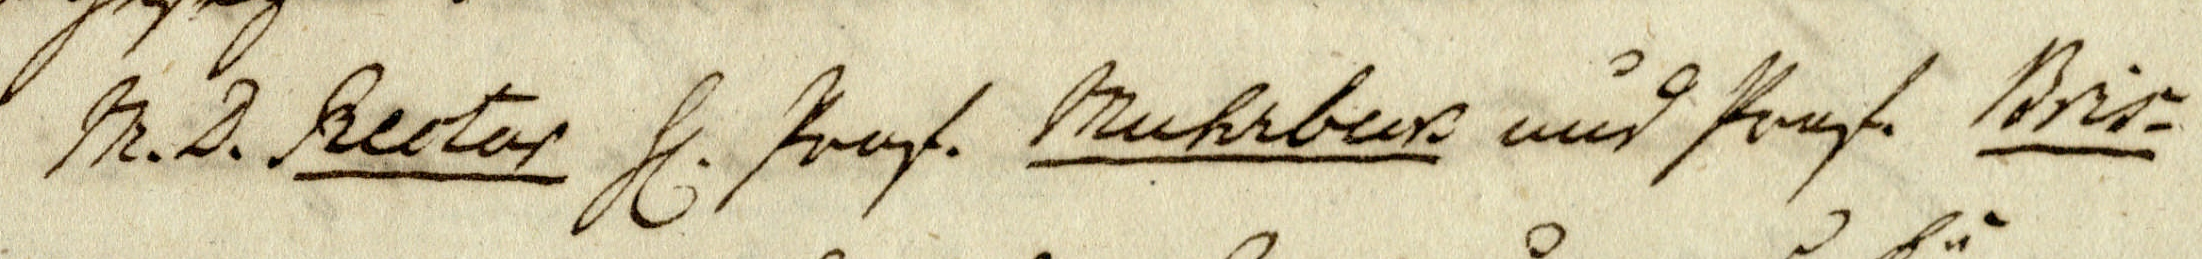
M. D. Rector H. Prof. Muhrbeck und Prof. Bris¬
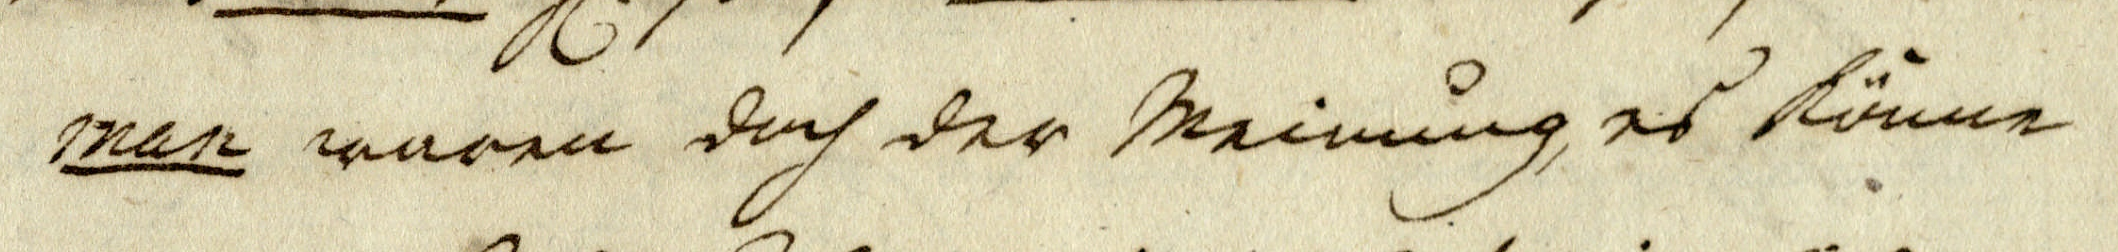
man wären doch der Meinung, es könne
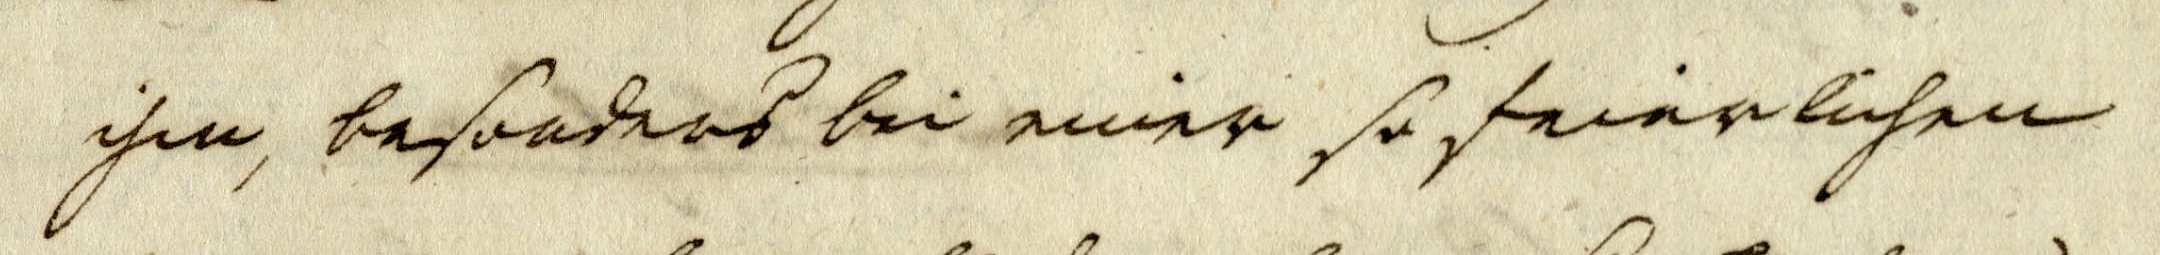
ihm, besonders bei einer so feierlichen
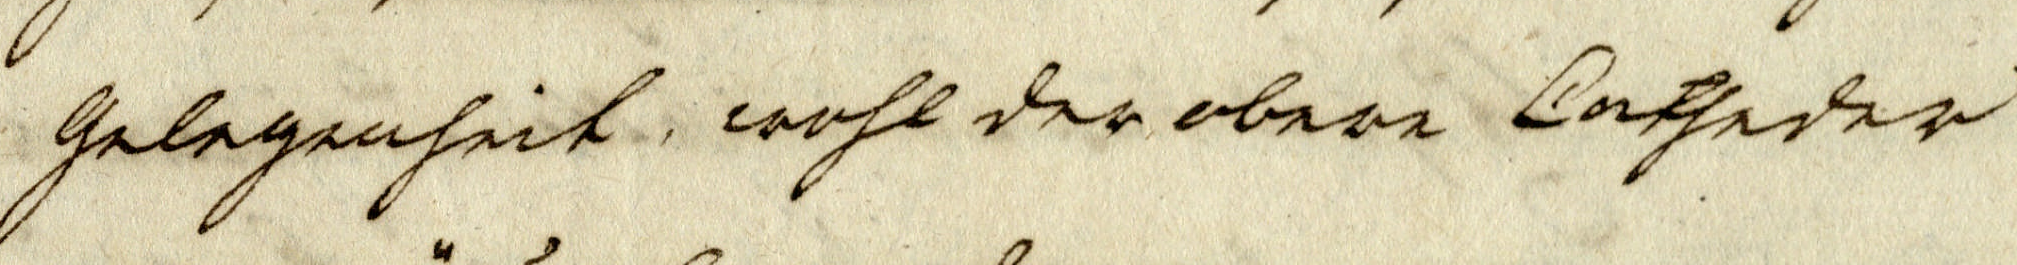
Gelegenheit, wohl der obere Catheder
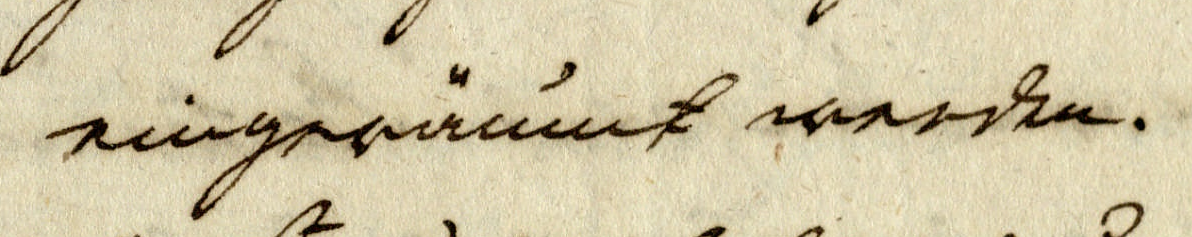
eingeräumt werden.
